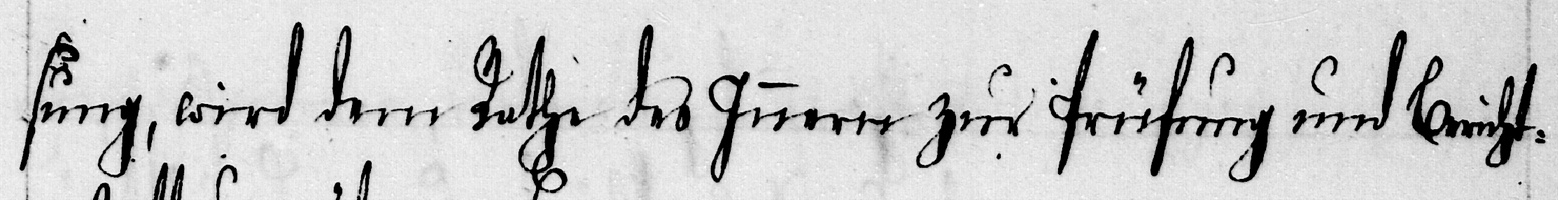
sung, wird dem Rathe des Innern zur Prüfung und Berich¬
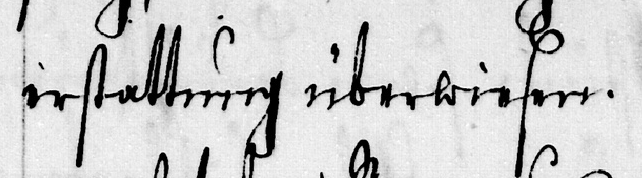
terstattung überwiesen.
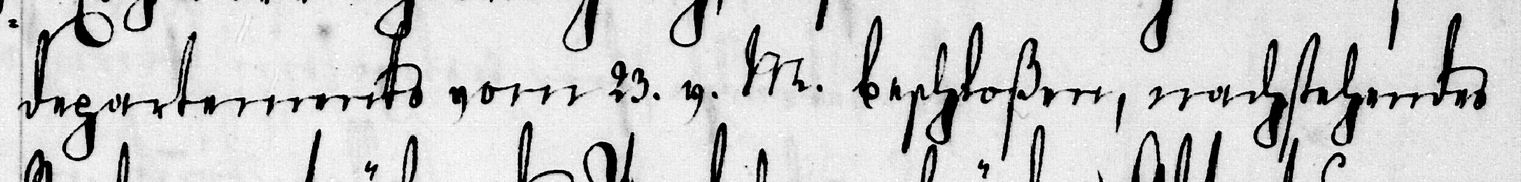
departements vom 23. v. M. beschloßen, nachstehendes
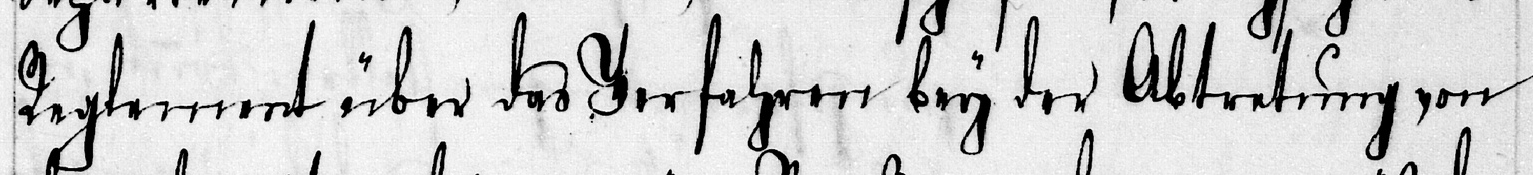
Reglement über das Verfahren bey der Abtretung von
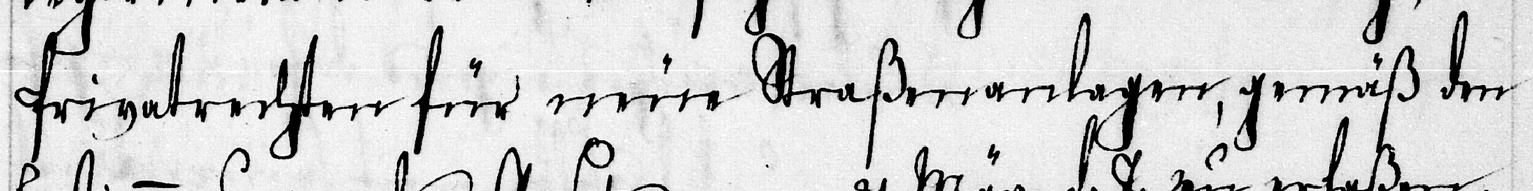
Privatrechten für neue Straßenanlagen, gemäß den
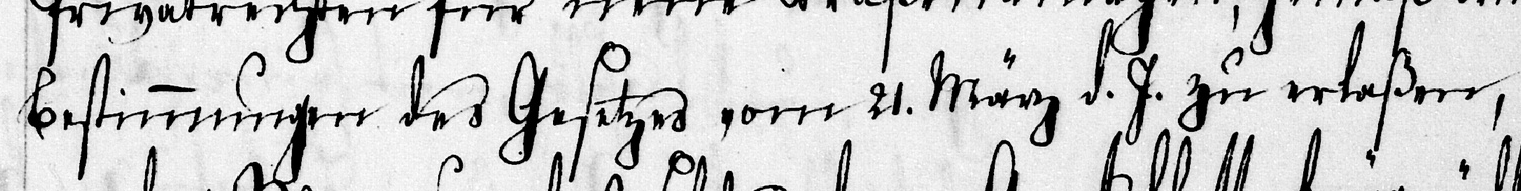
Bestimmungen des Gesetzes vom 21. März d. J. zu erlaßen,
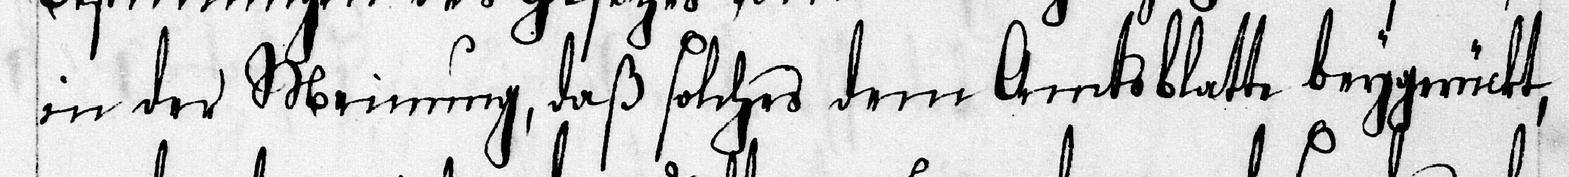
in der Meinung, daß solches dem Amtsblatte beygerückt,
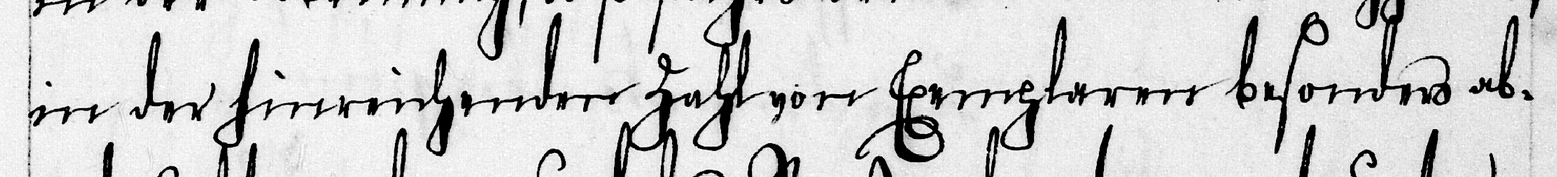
in der hinreichenden Zahl von Exemplaren besonders ab¬
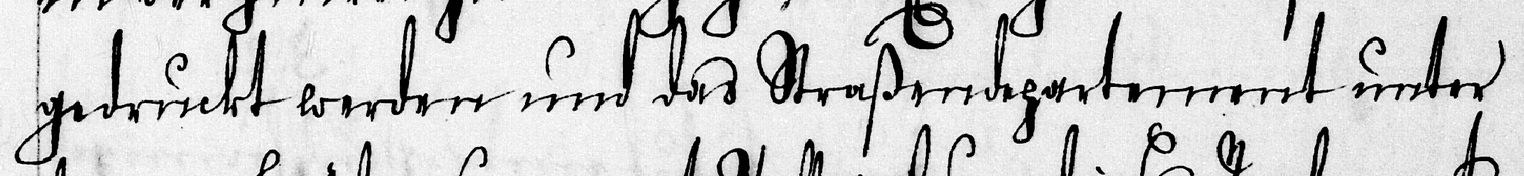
gedruckt werden und das Straßendepartement unter
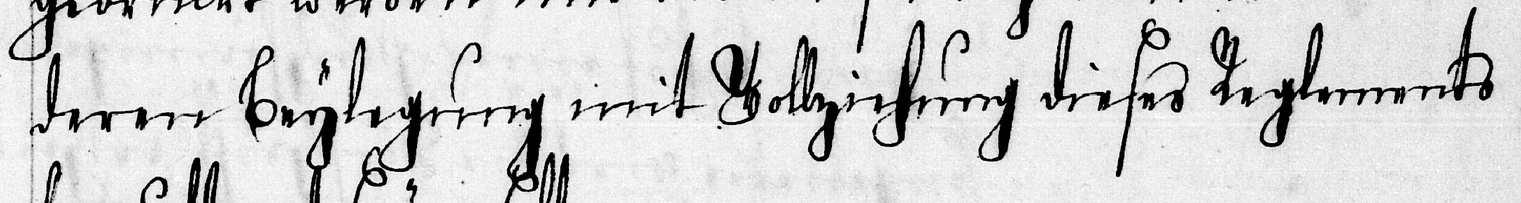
deren Beylegung mit Vollziehung dieses Reglements
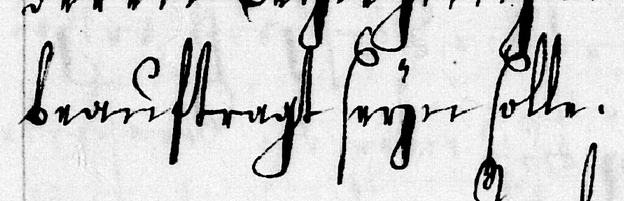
beauftragt seyn solle.
